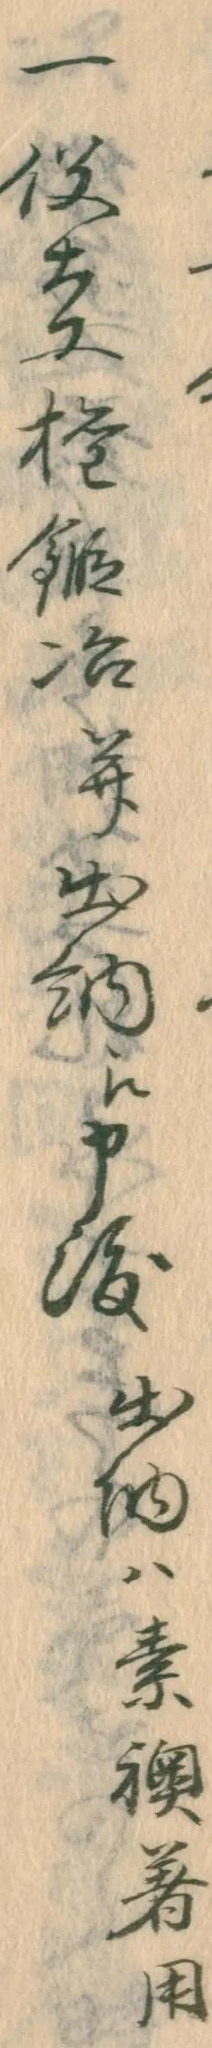一役大工権鍛冶并出納江申渡出納ハ素襖着用
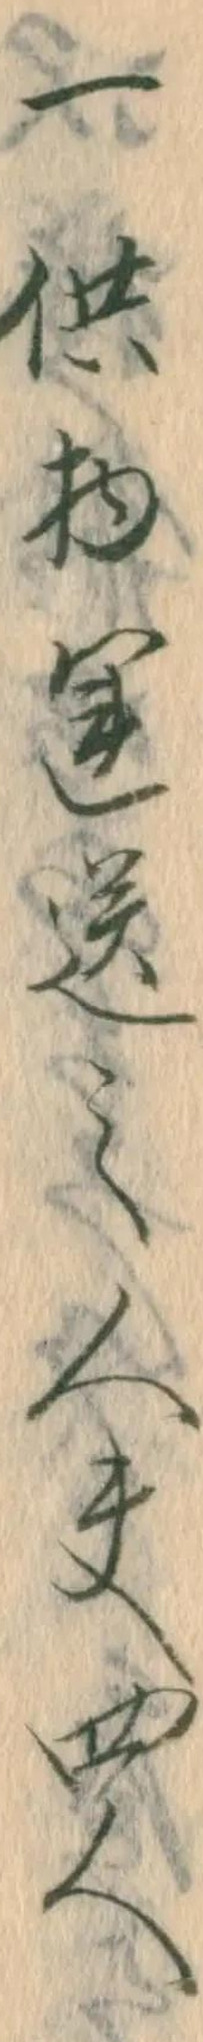一供物運送之人夫四人
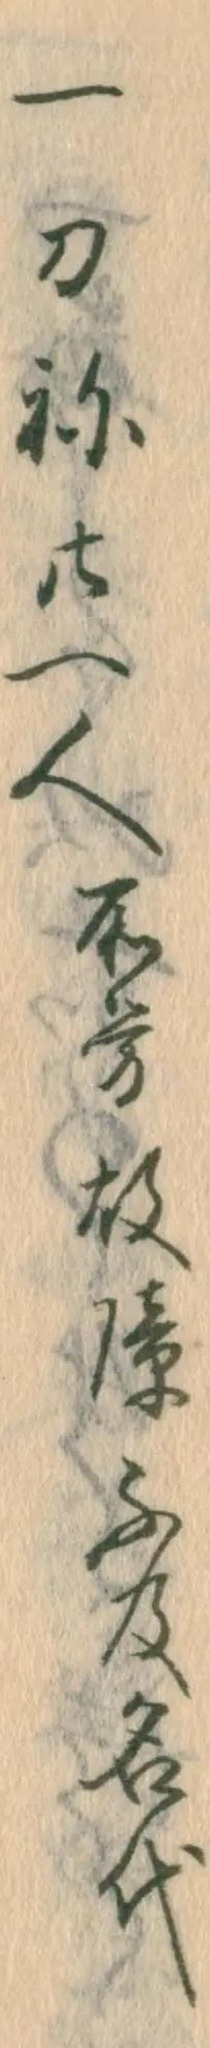一刀祢廿一人所労故障不及名代
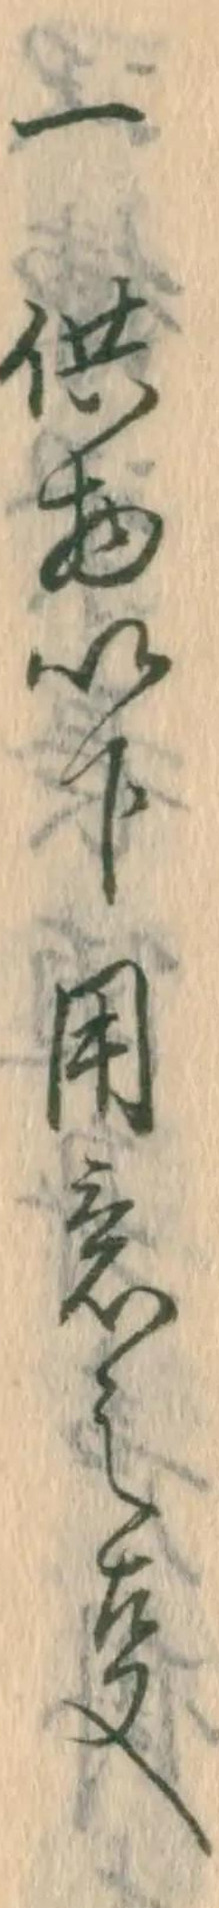一供物以下用意之事
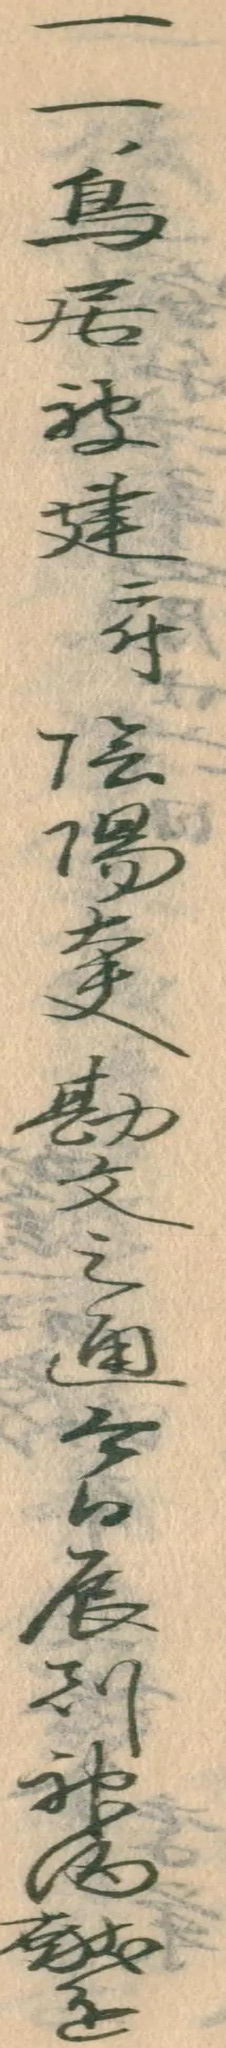一一ノ鳥居被建ニ付陰陽大夫勘文之通今日辰刻神酒献進
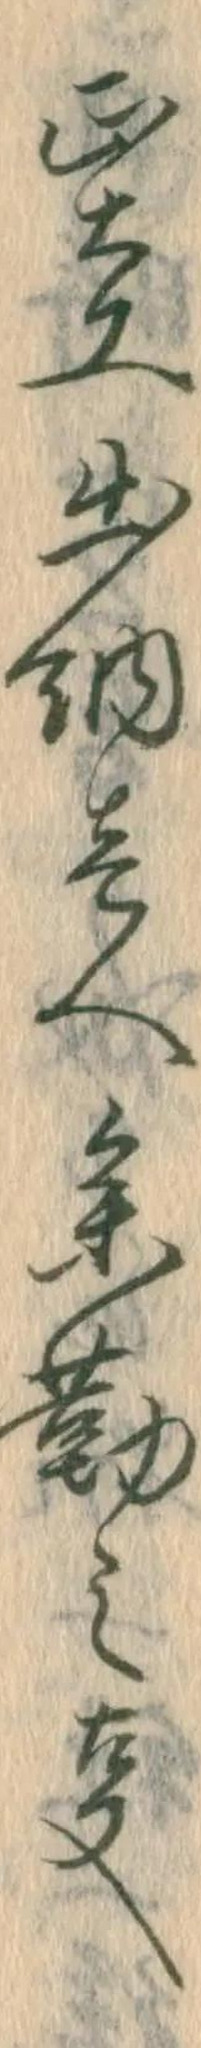正大工出納壱人参勤之事
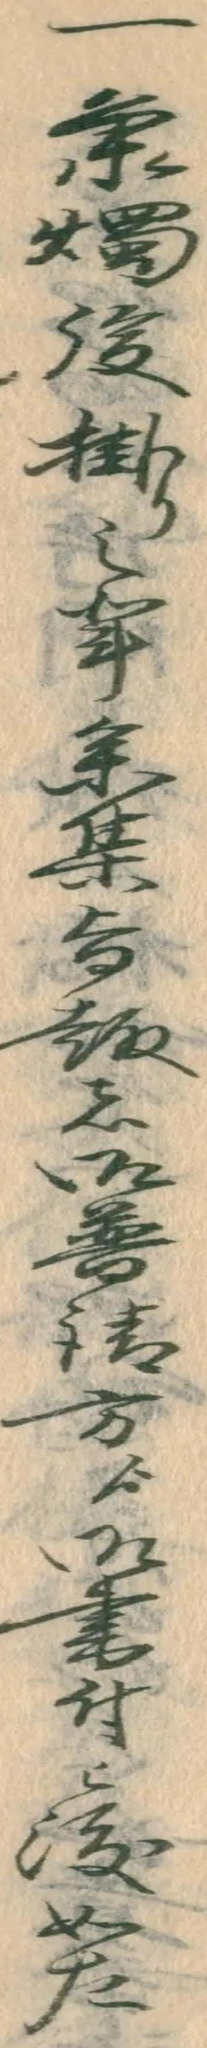一秉燭後掛り之輩参集旨趣は御普請方ゟ御書付被渡如左
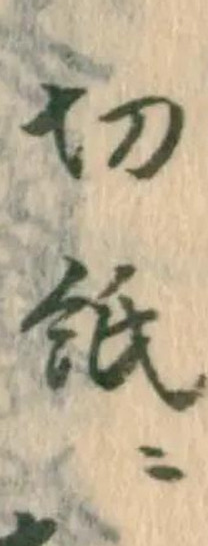切紙ニ
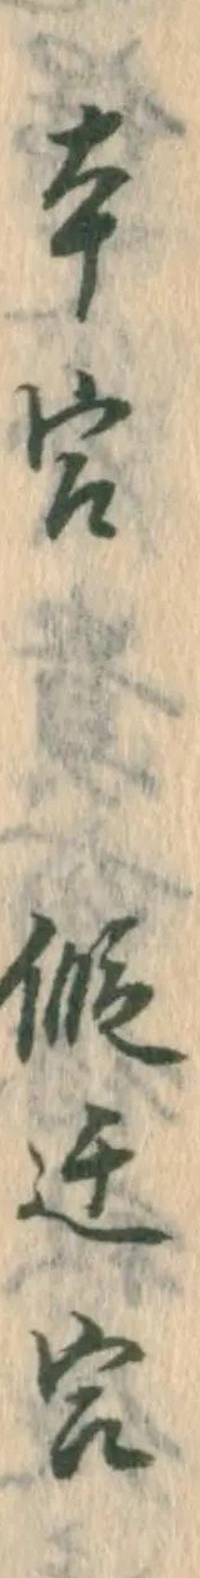本宮仮迁宮
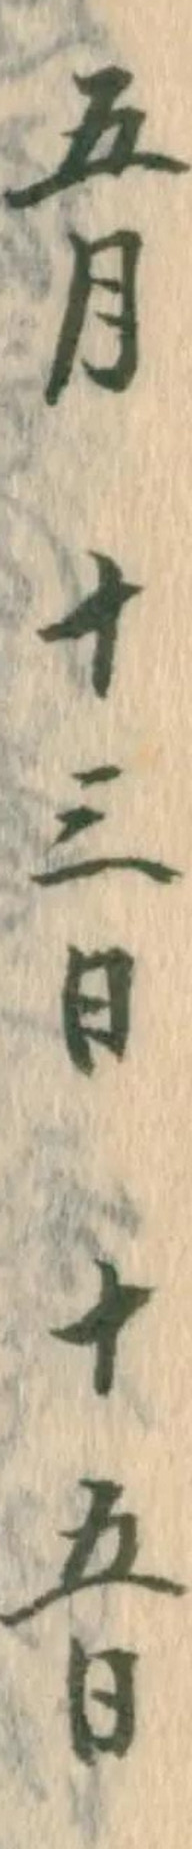五月十三日十五日
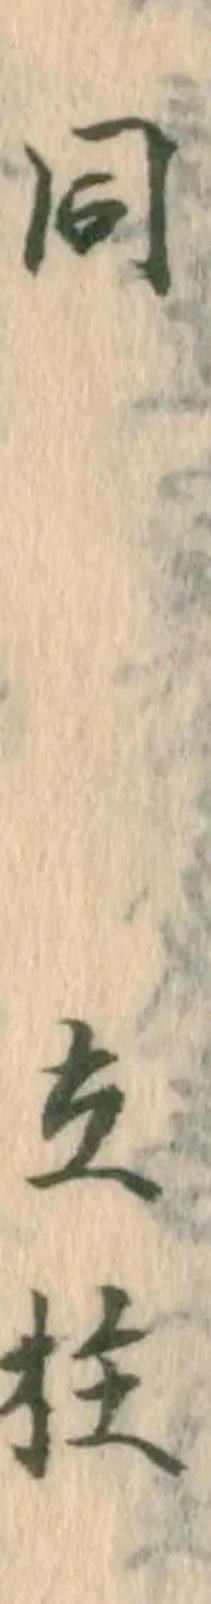同立柱
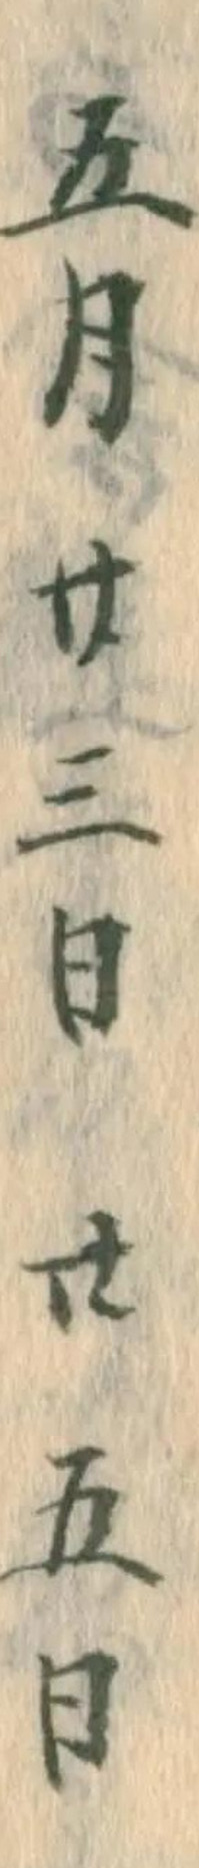五月廿三日廿五日
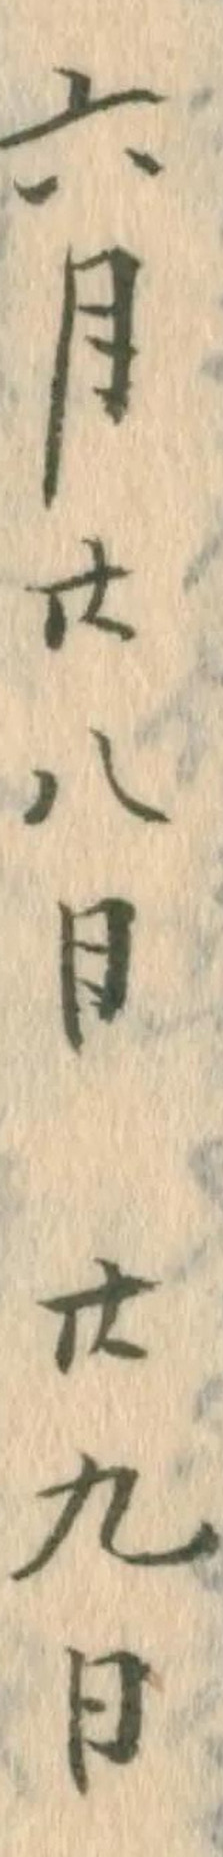六月廿八日廿九日
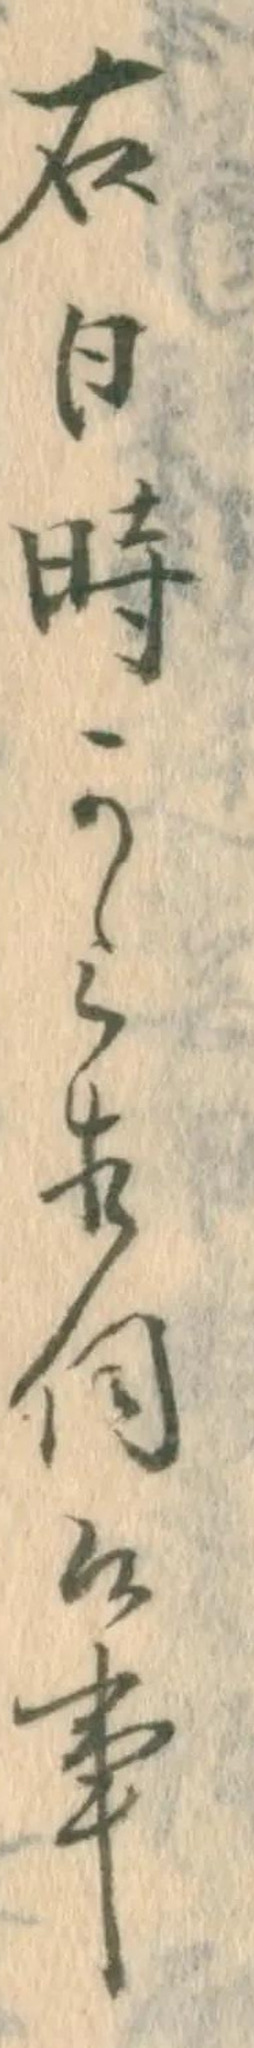右日時可被相伺候事
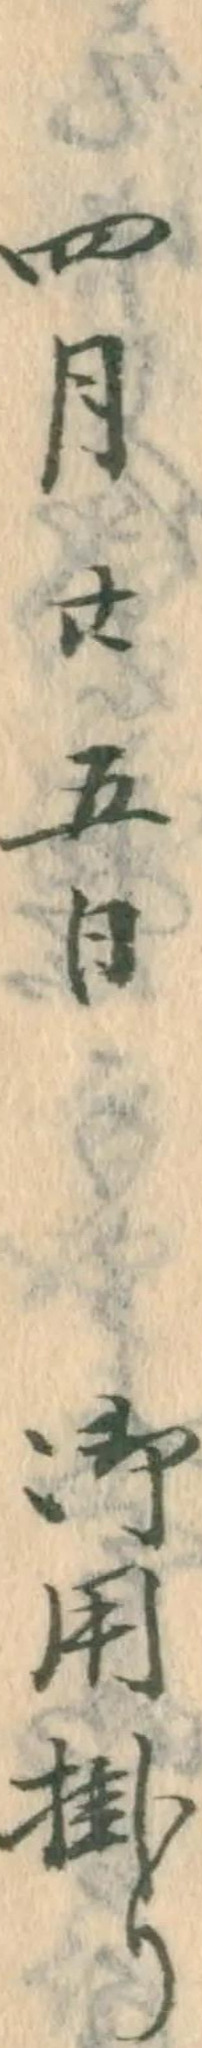四月廿五日御用掛り
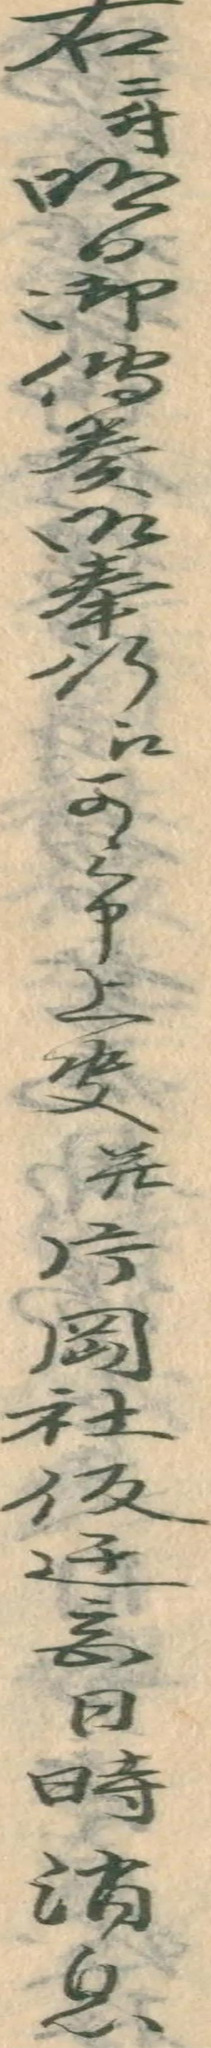右ニ付明日御伝奏御奉行江可被申上決并片岡社仮迁宮日時消息
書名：賀茂社記録. 第17冊
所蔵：国立国会図書館 National Diet Library, JAPAN
